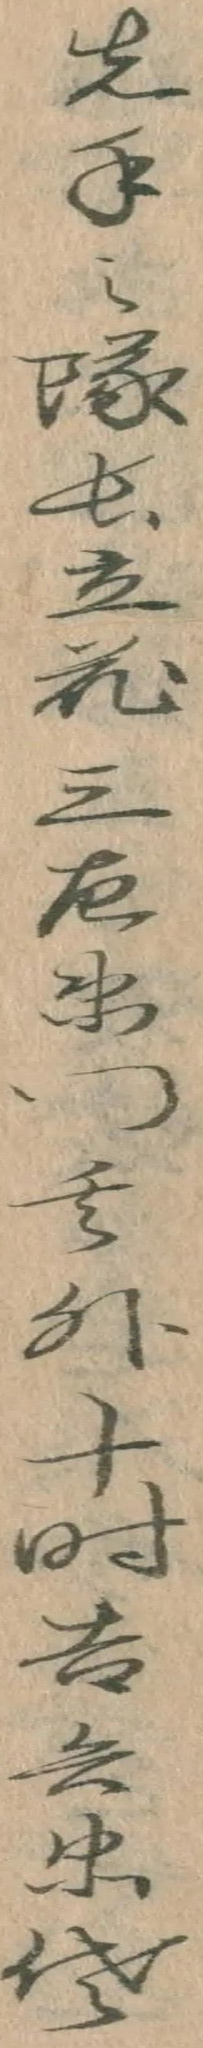先手之隊長立花三左衛門其外十時吉兵衛佐
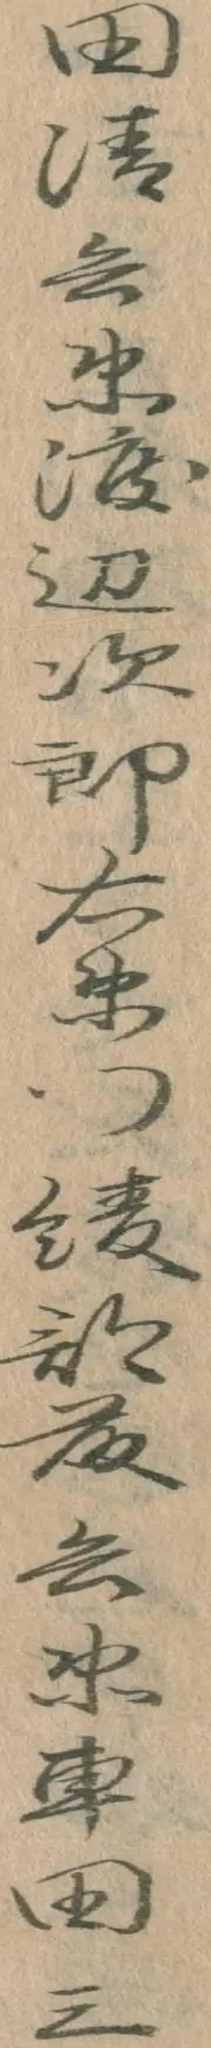田清兵衛渡辺次郎右衛門綾部藤兵衛車田三
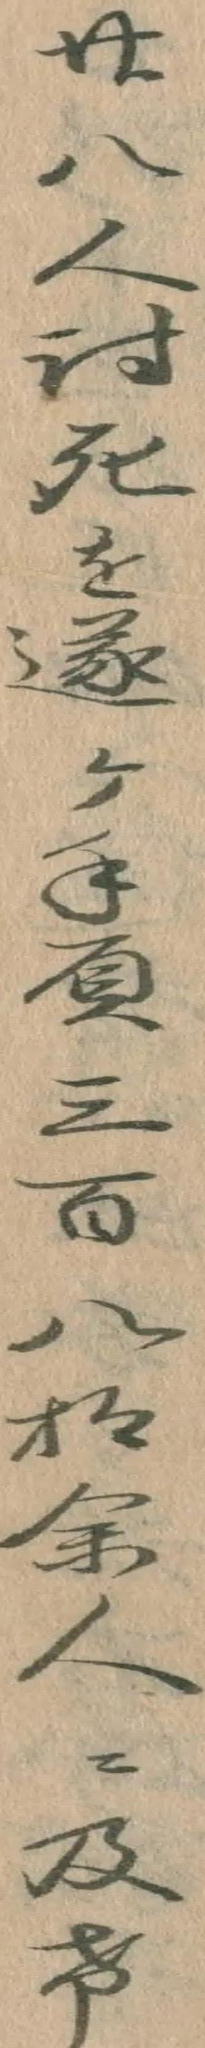廿八人討死を遂け手負三百八拾余人に及希
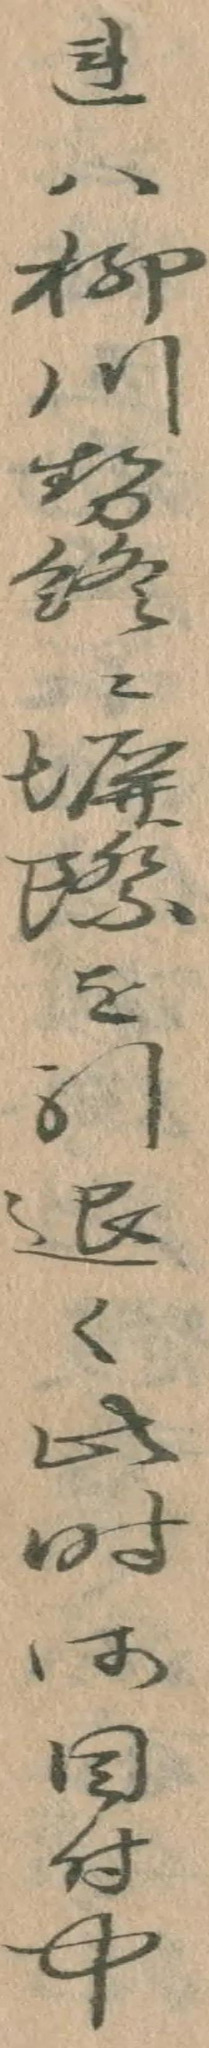連は柳川勢終に堀際を引退く此時御目付中
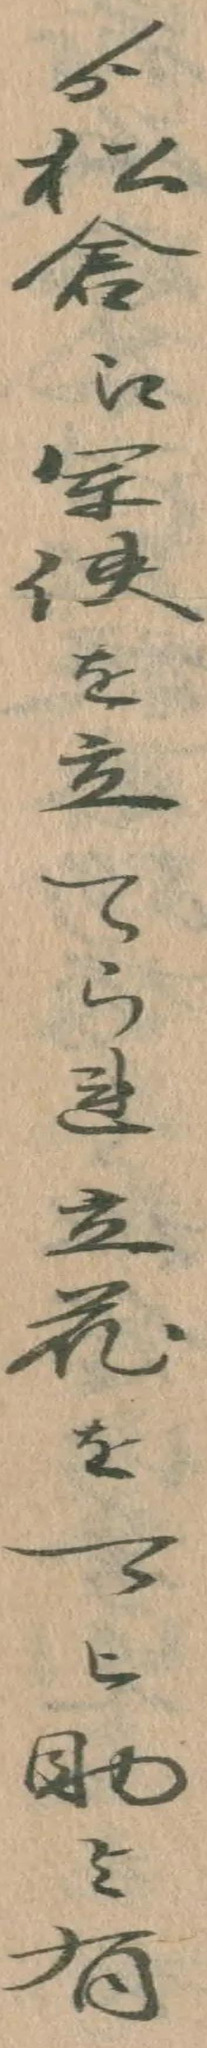ゟ松倉江軍使を立てら連立花を可被助与有
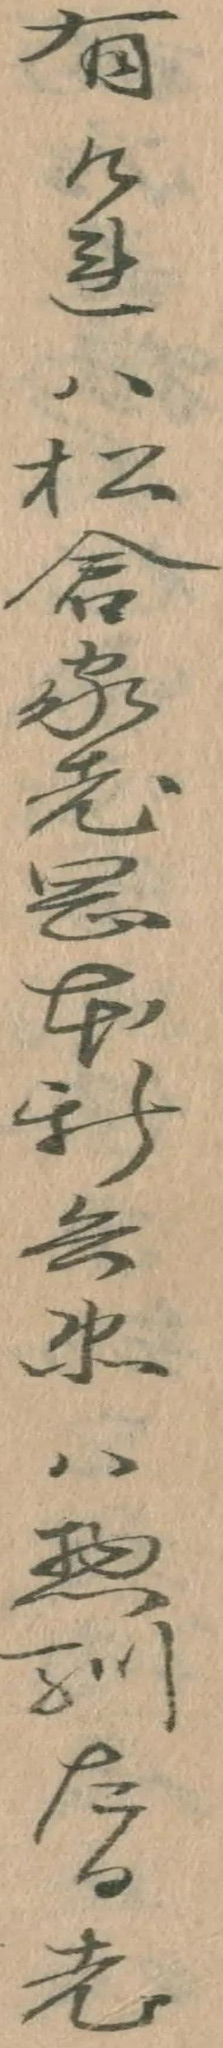有け連は松倉家老岡本新兵衛は惣馴たる老
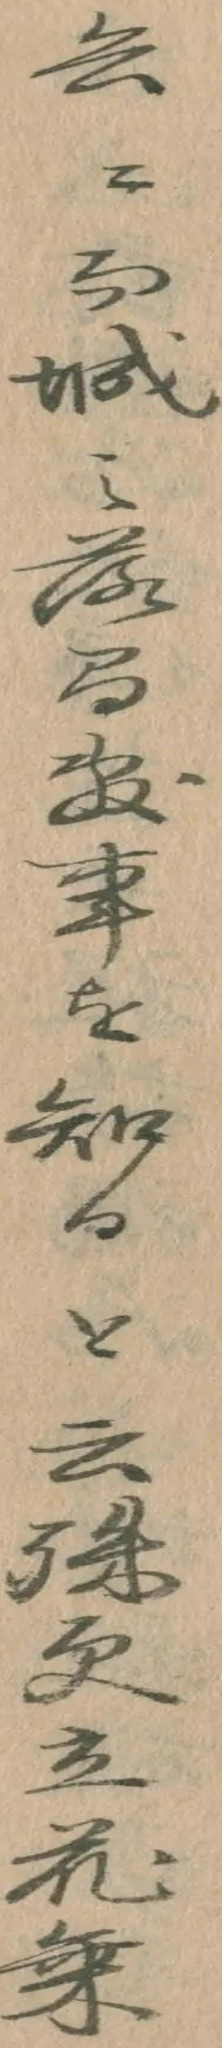兵に而城之落間敷事を知ると云殊更立花乗
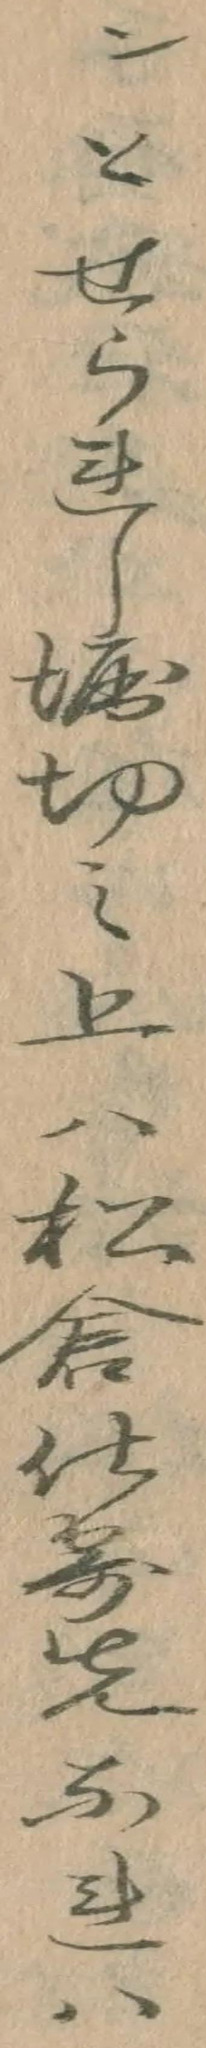んとせら連し堀切之上は松倉仕寄先な連は
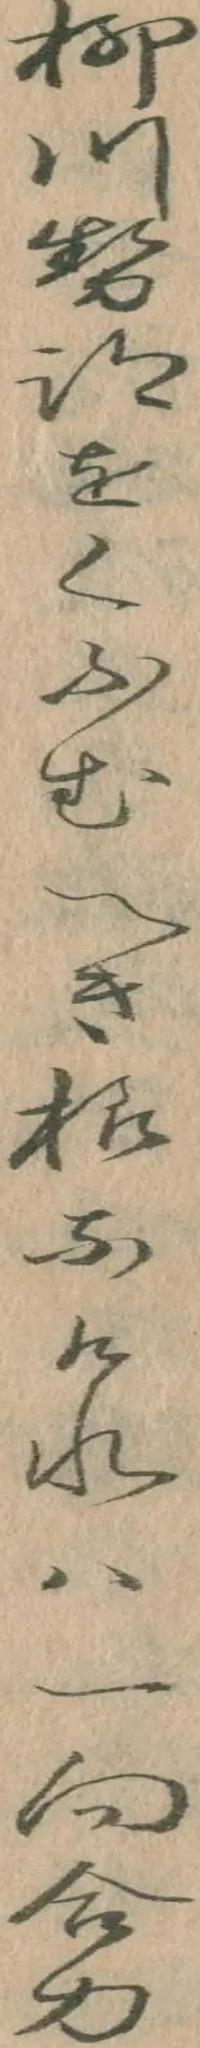柳川勢跡をくふむへき様なけれは一向合力
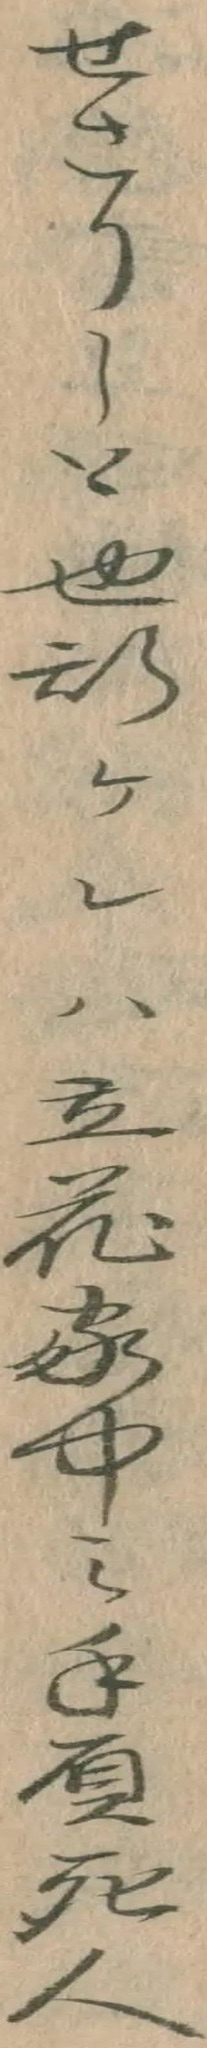せさりしと也斯けれは立花家中之手負死人
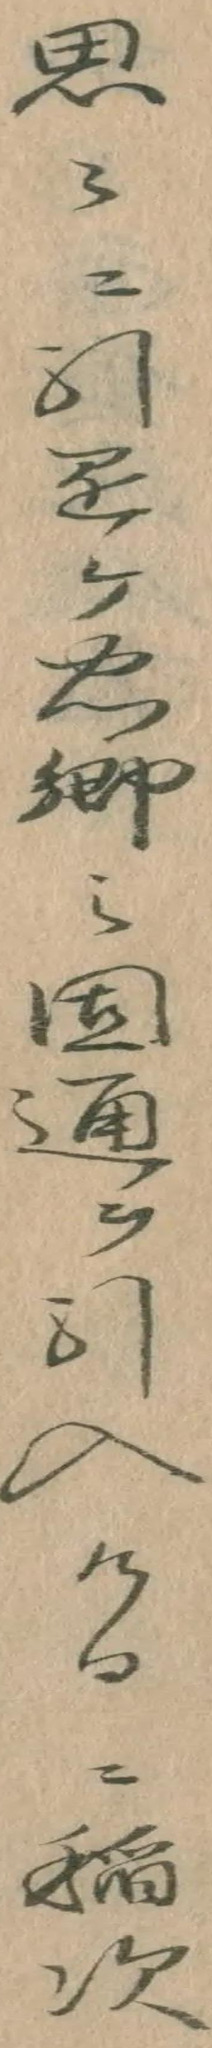思々に引懸け忠郷之固通を引入けるに稲次
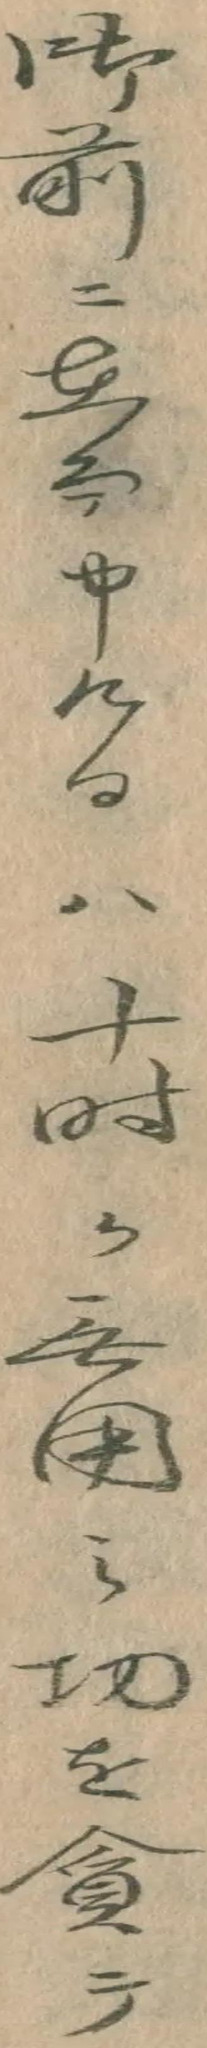御前に在而申けるは十時か無用之功を貧て
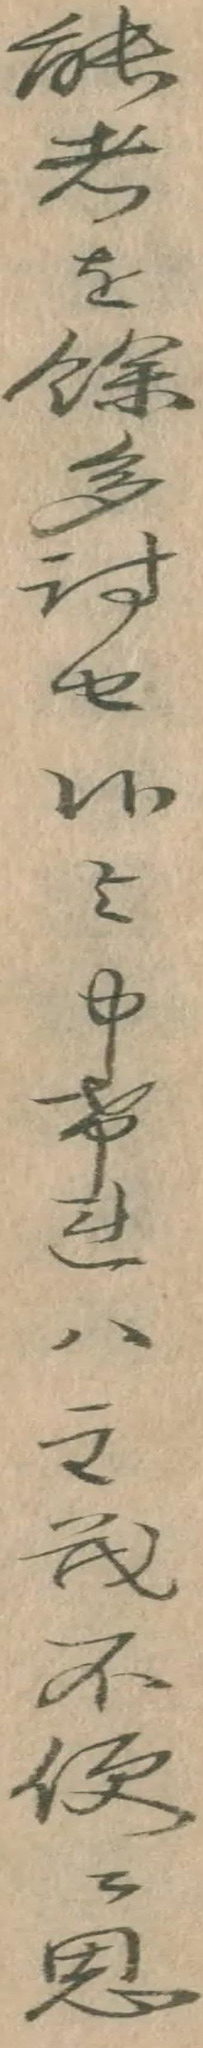能者を余多討せ候与申希連は主茂不便に思
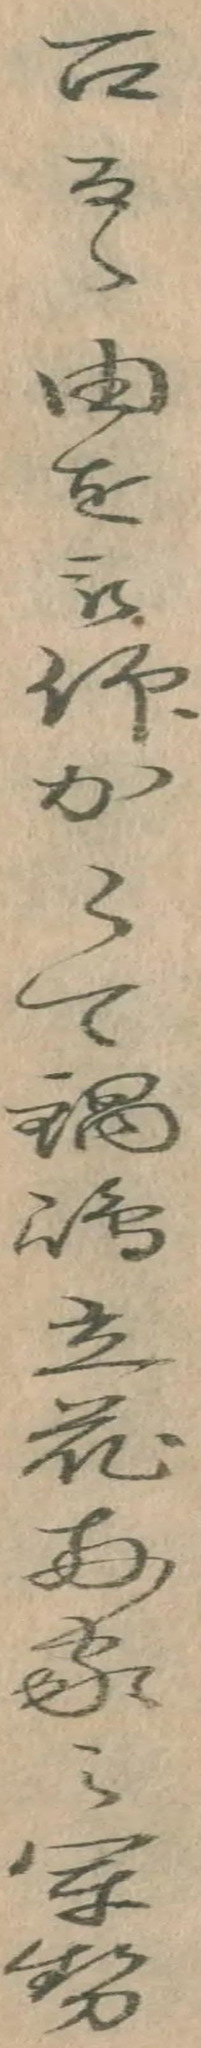召るゝ由を被仰かくて鍋島立花両家之軍勢
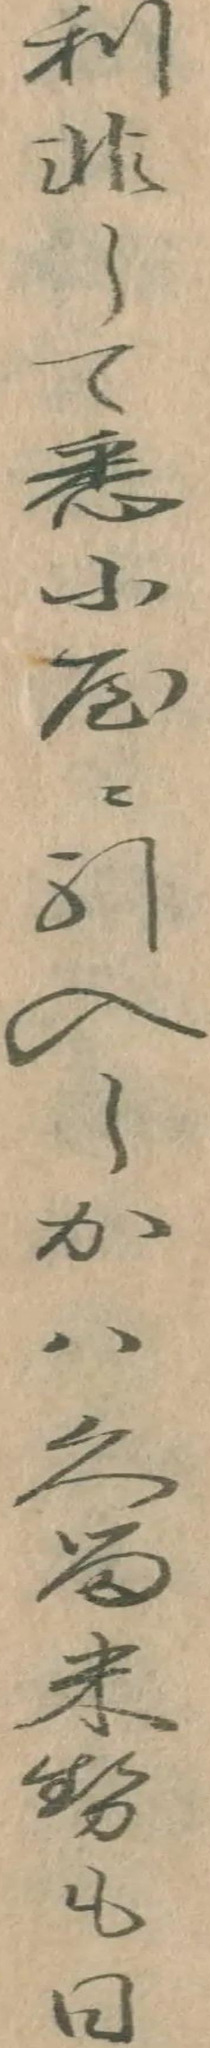利非して悉小屋に引入しかは久留米勢も日

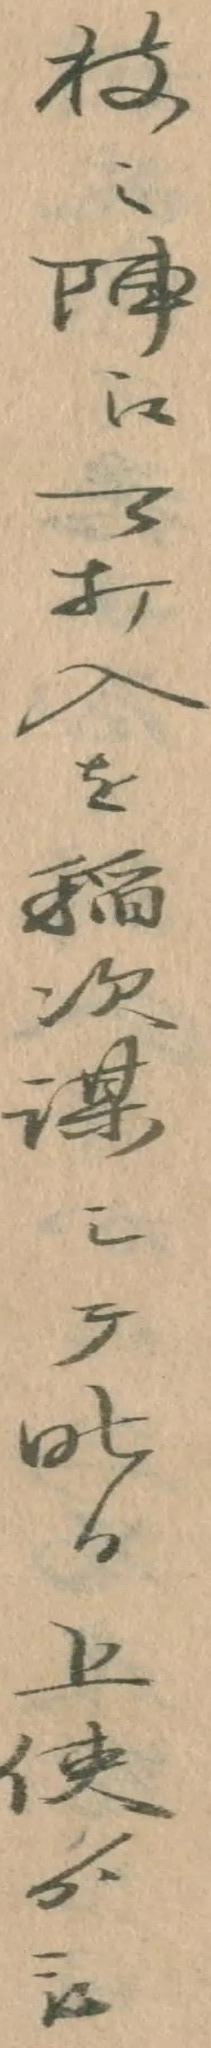枝之陣江可打入を稲次謀して昨日上使ゟ被
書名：切支丹御退治記 49巻. [4]
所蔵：国立国会図書館 National Diet Library, JAPAN
